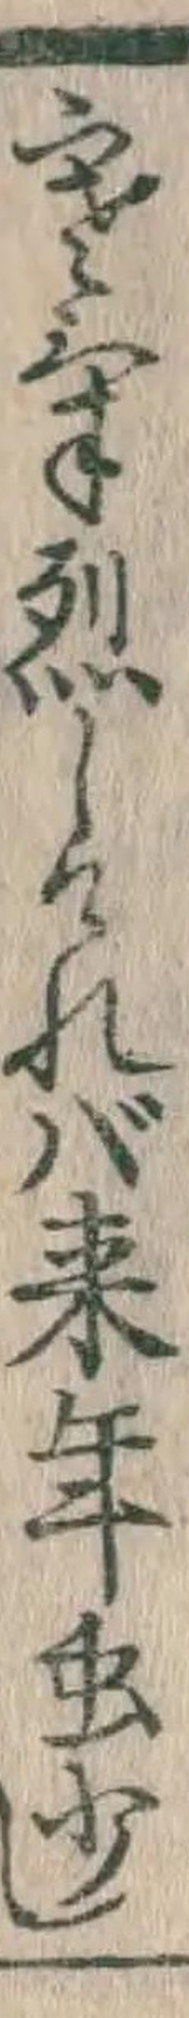寒気烈しければ来年虫少し
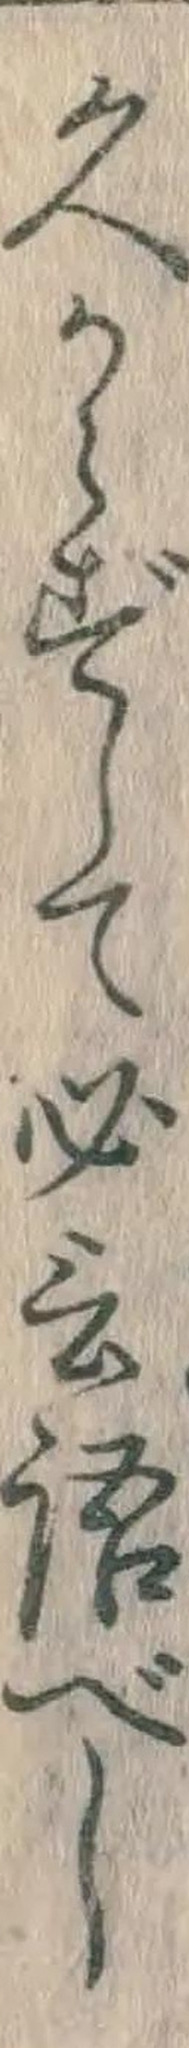久からずして必言語べし
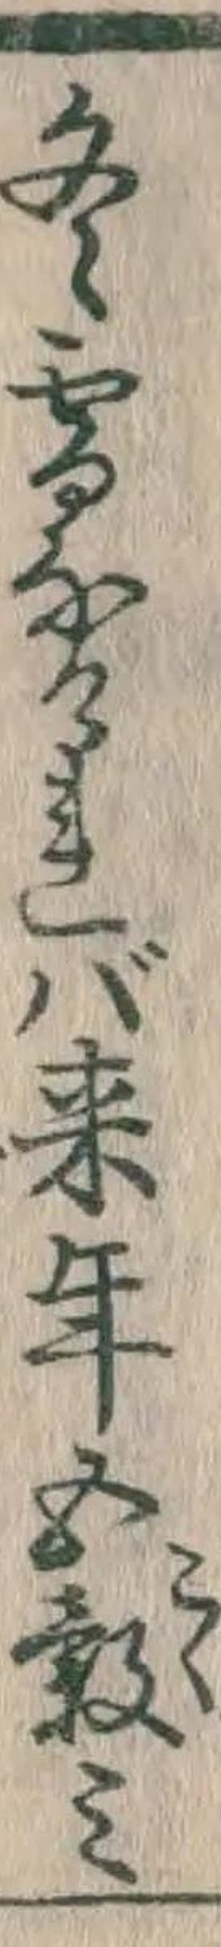冬雪なければ来年五穀み
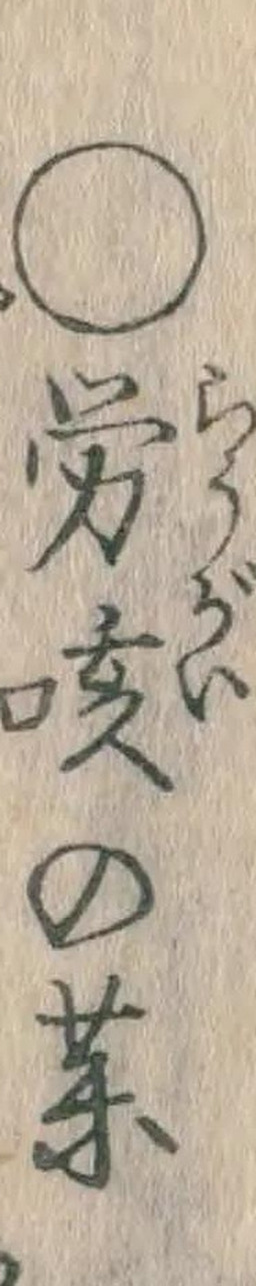○労咳の薬
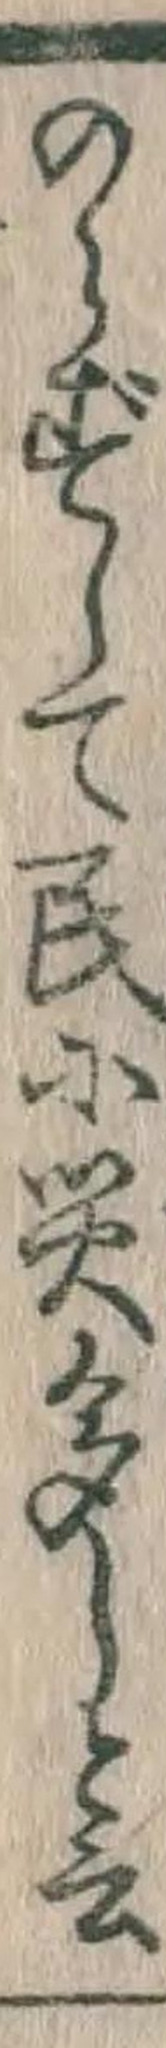のらずして民に災多しと云
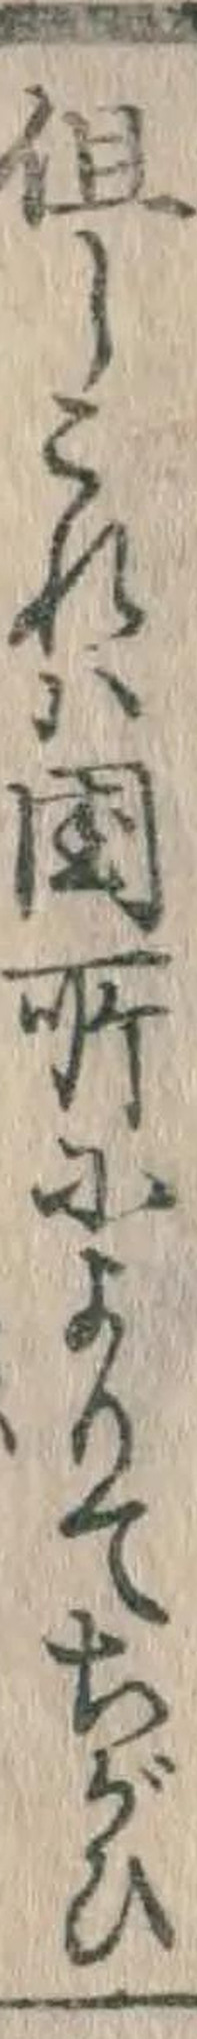但しこれは国所によりてちがひ
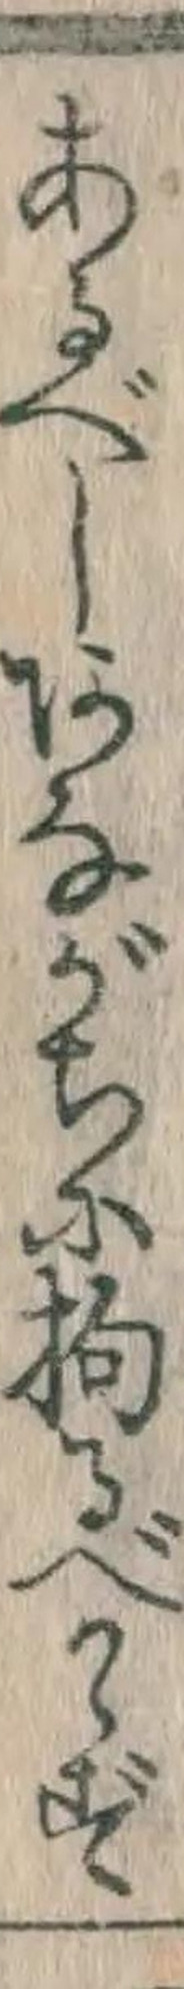あるべしあながちに拘るべからず
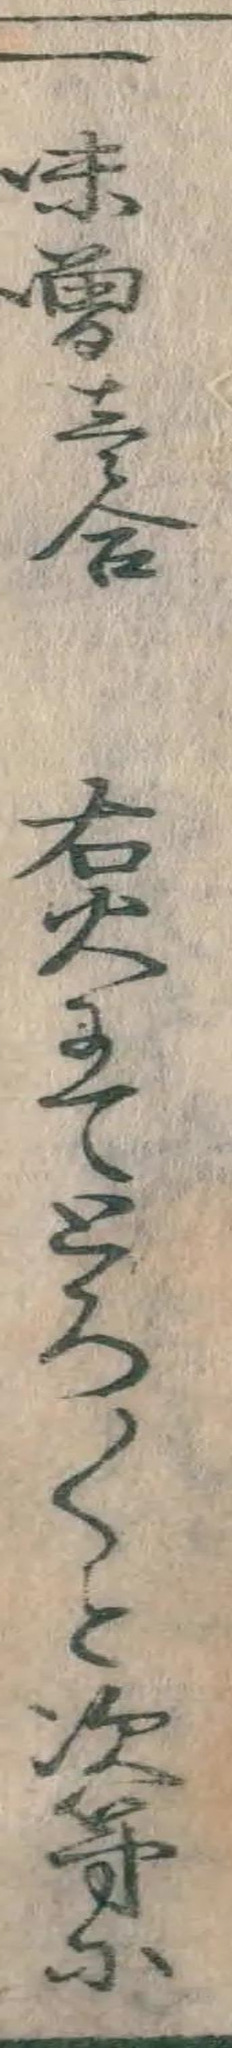一味噌壱合右火にてとろ〳〵と次第に
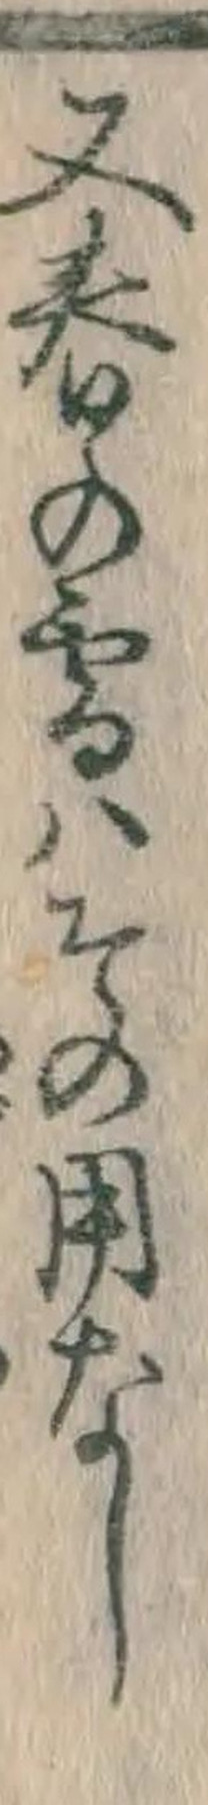又春の雪はその用なし
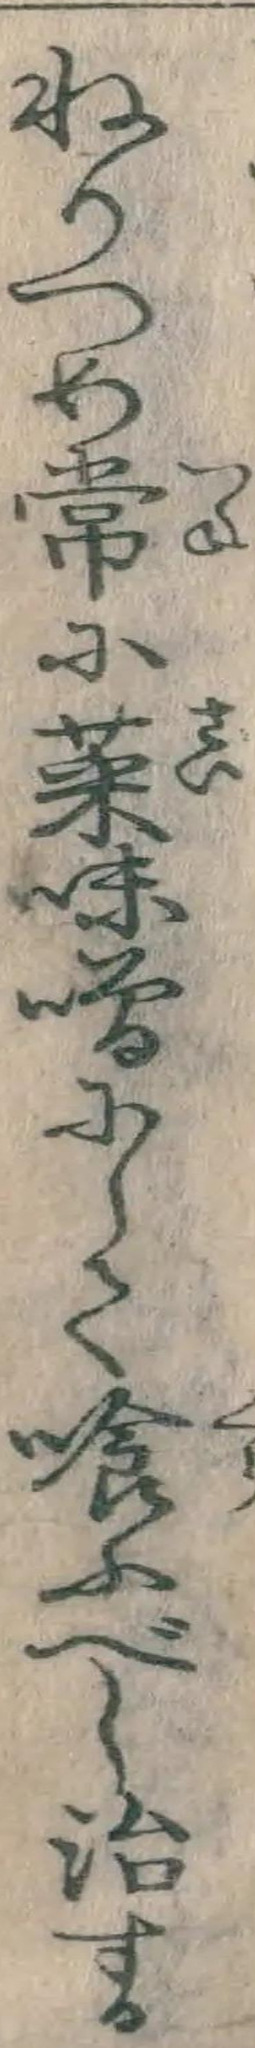ねりつめ常に菜味噌にして喰ふべし治する
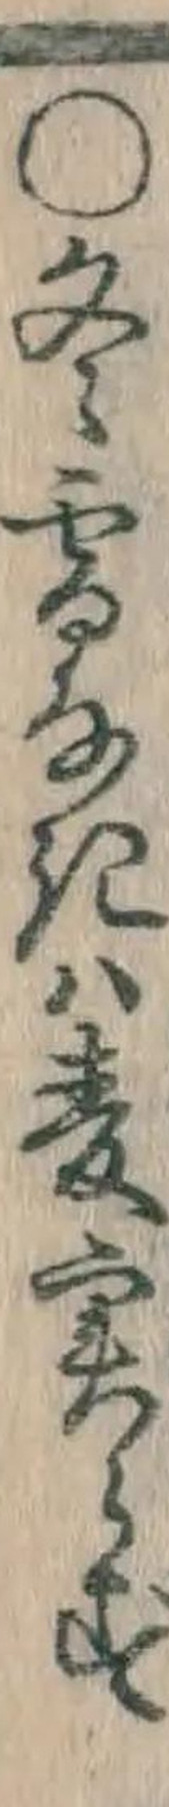○冬雪なきは麦実らず
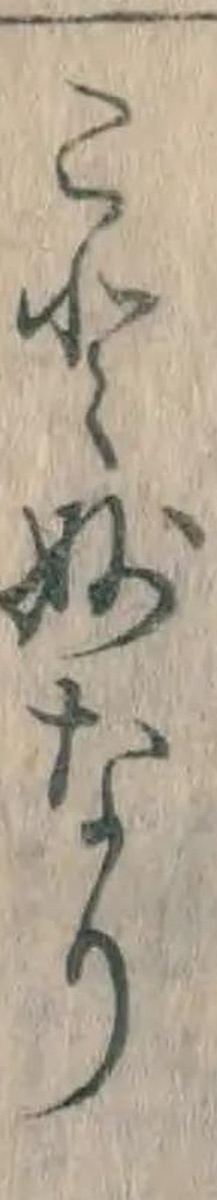こと妙なり

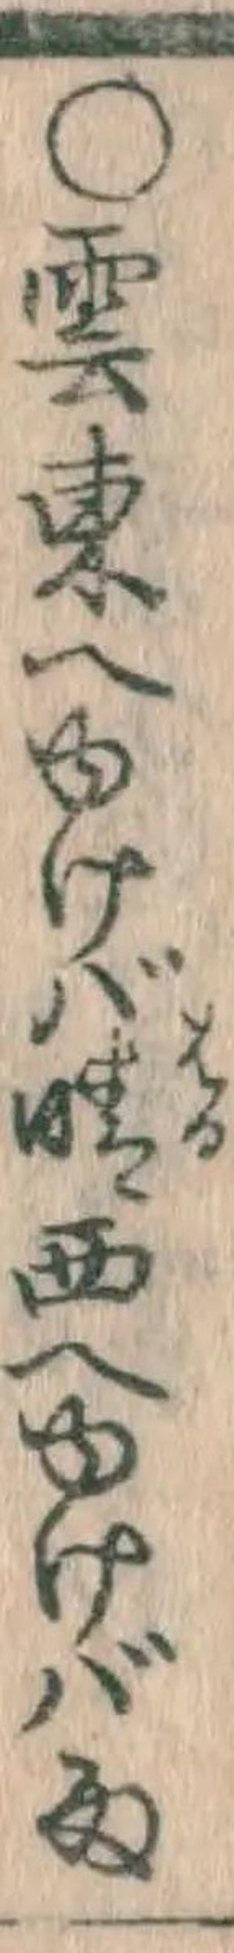○雲東へゆけば晴西へゆけば雨
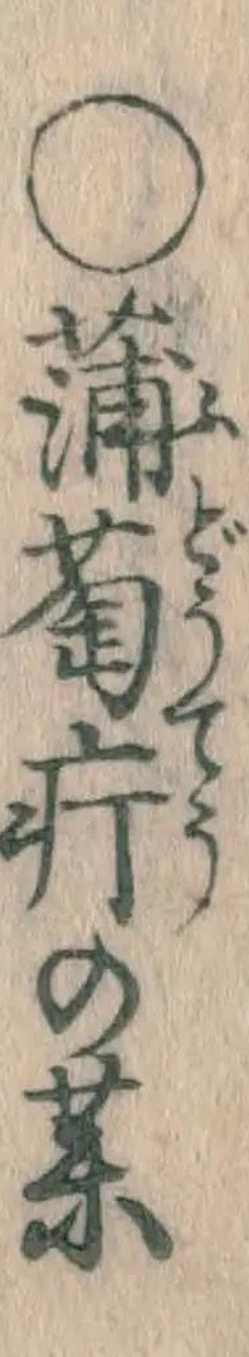○蒲萄疔の薬
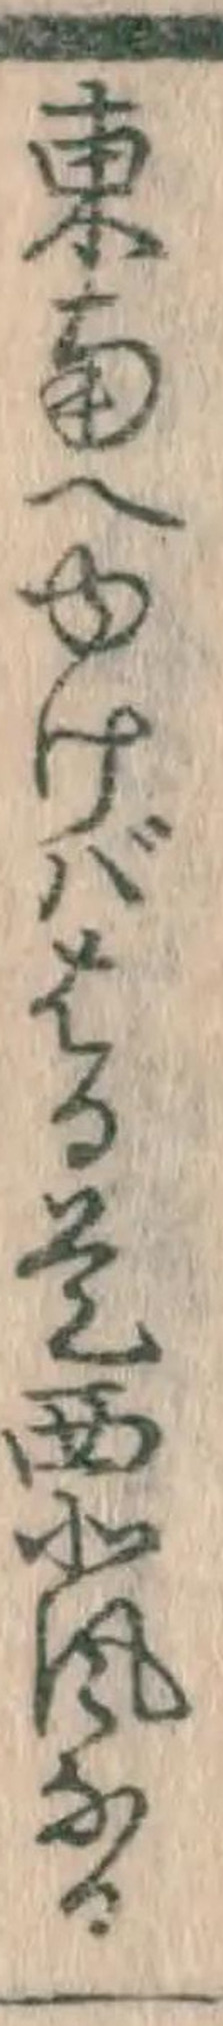東南へゆけばはる是西北風なる
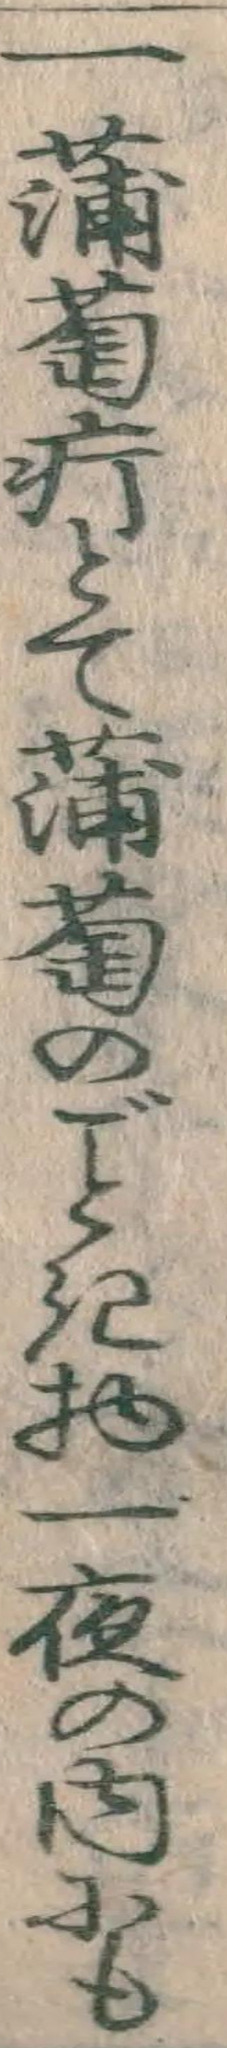一蒲萄疔とて蒲萄のごとき物一夜の内にも
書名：広益秘事大全 3巻. [4]
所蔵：国立国会図書館 National Diet Library, JAPAN
